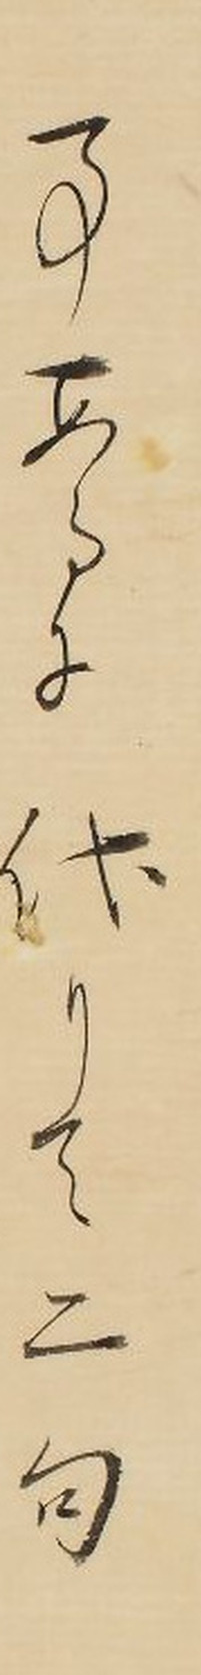事あるに代りて二句
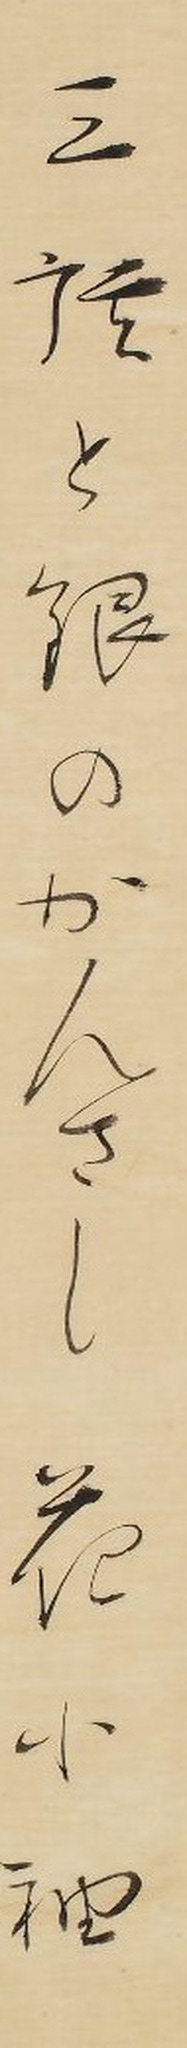三弦と銀のかんさし花小袖
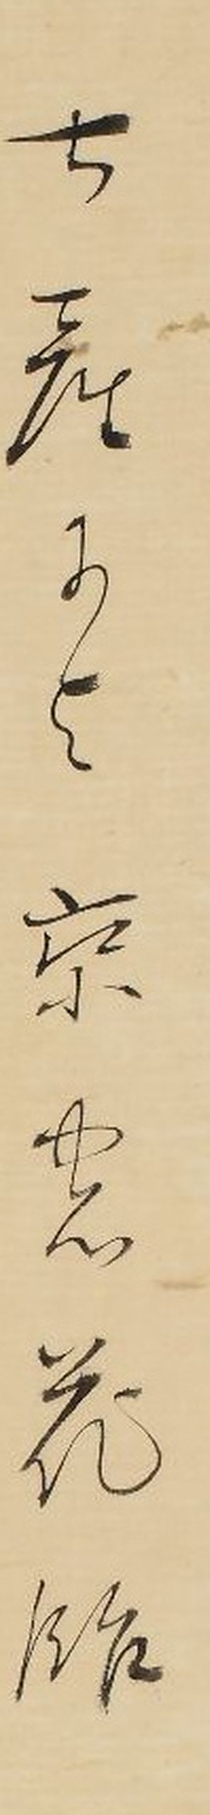土産にと京の花飴
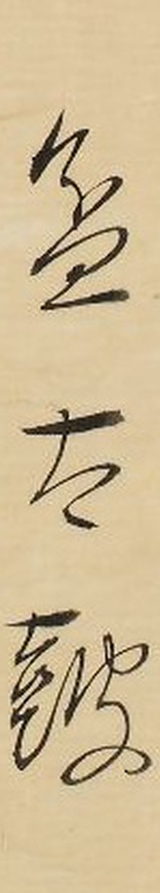盆太皷
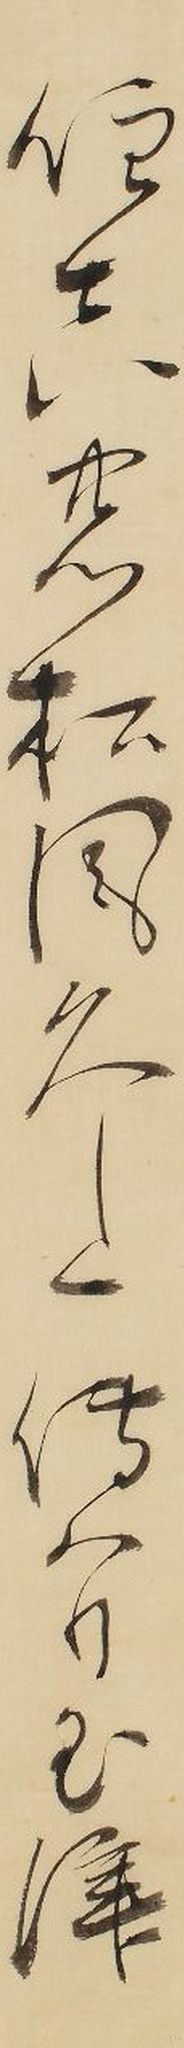住吉の松風久しく伝はり玉津
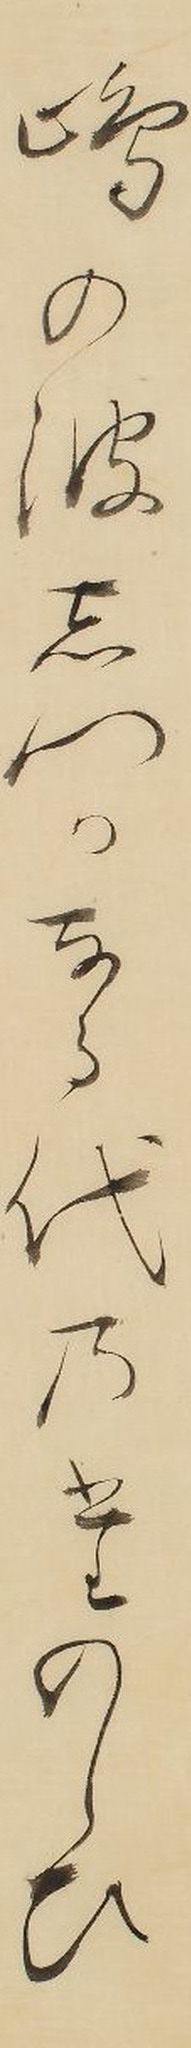嶋の波しつかなる代たのしひ
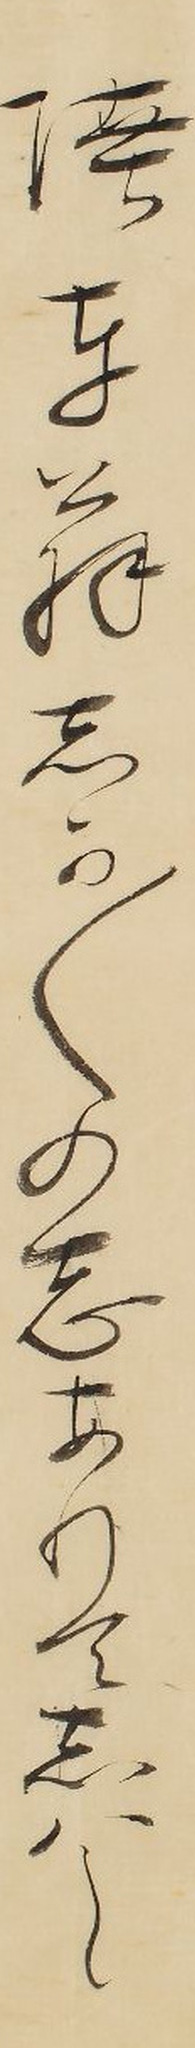陸車翁しか〳〵の志ありてしはし
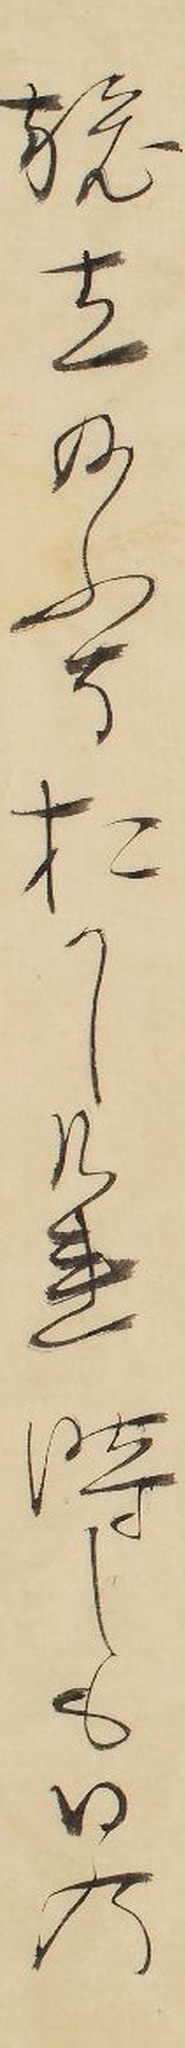旅立給ふそおかしけれ時しも日の
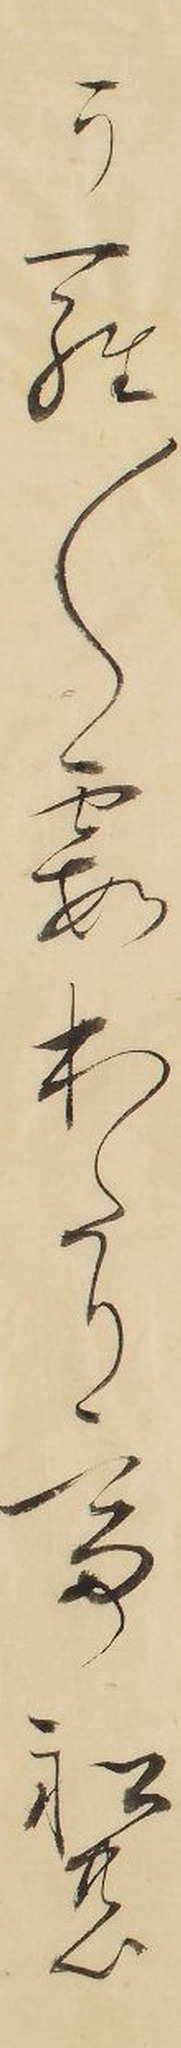うら〳〵霞わたりて船の
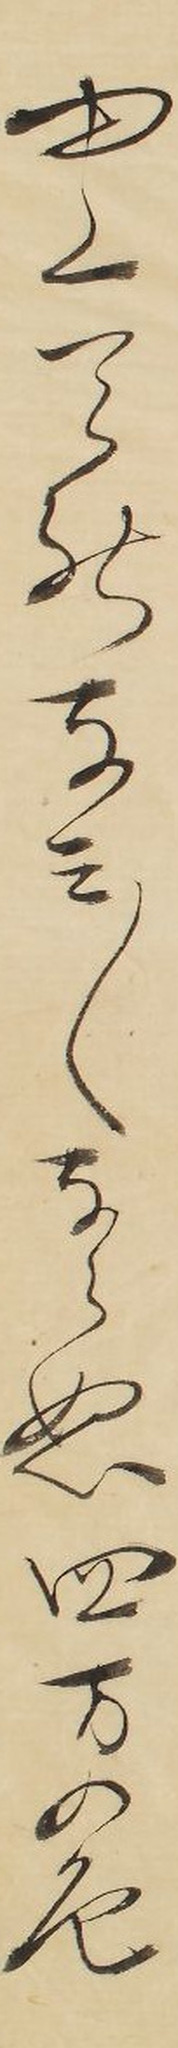ゆくてのなみ〳〵ならぬ四方の色

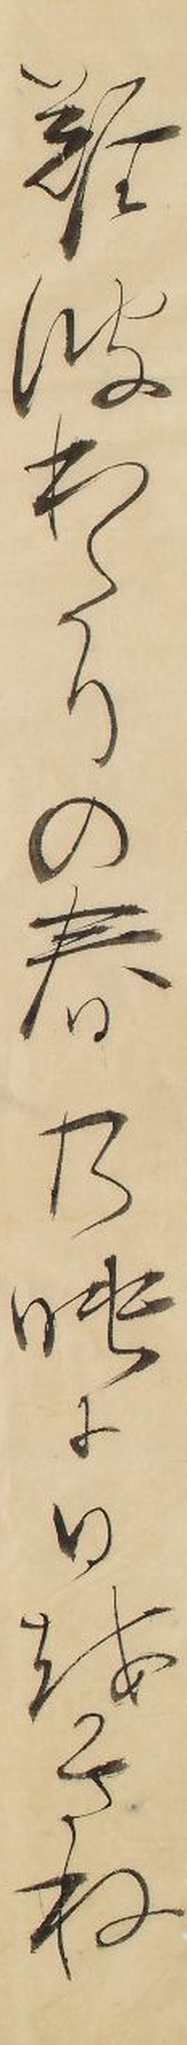難波わたりの春の眺に日をかさね
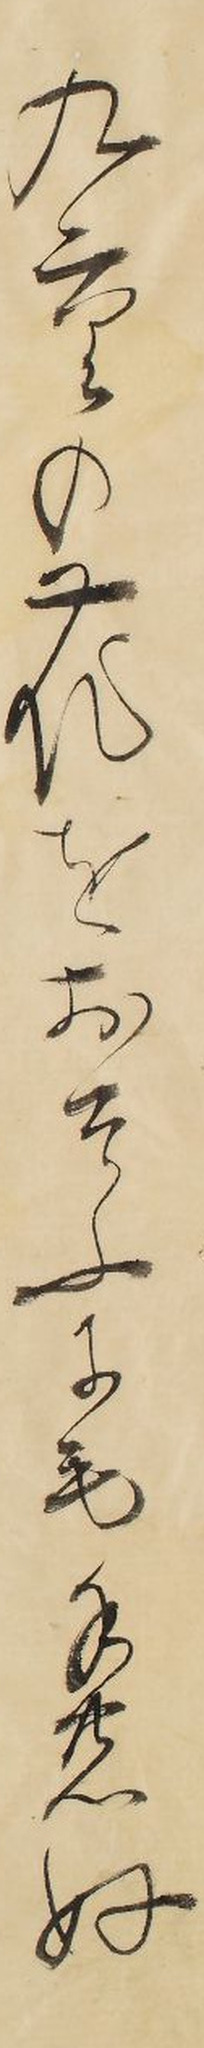九重の花をおそふにも手の奴
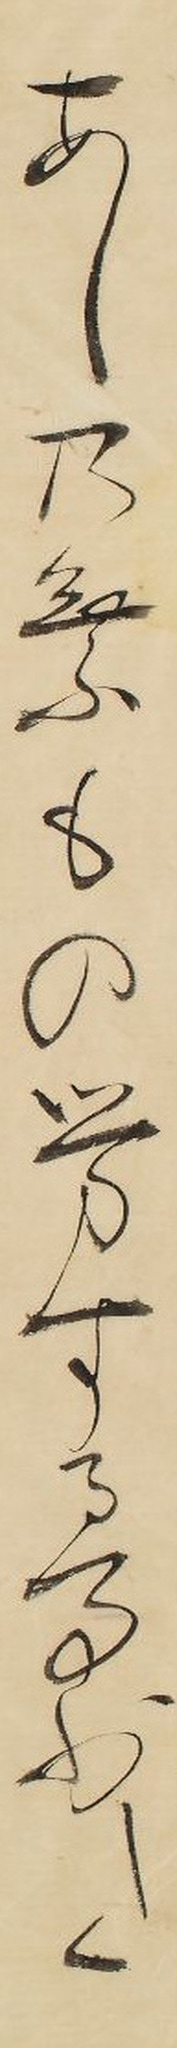あしの乗もの労する事少しく
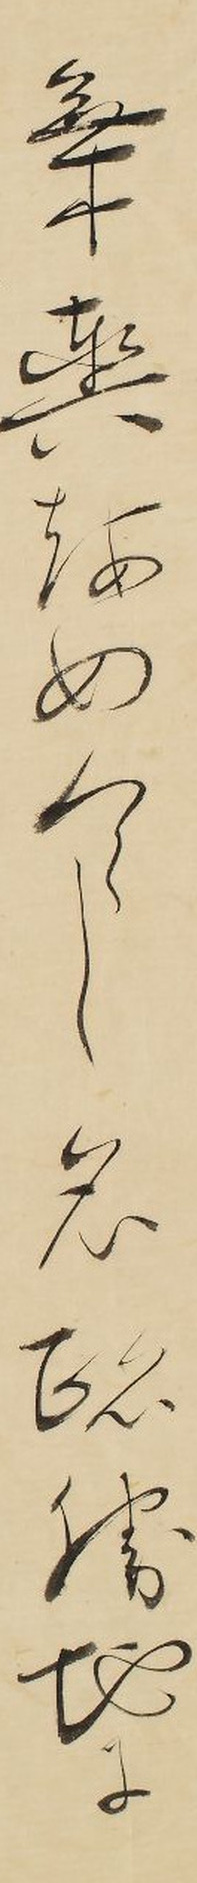乗輿をめくらし名跡勝地に
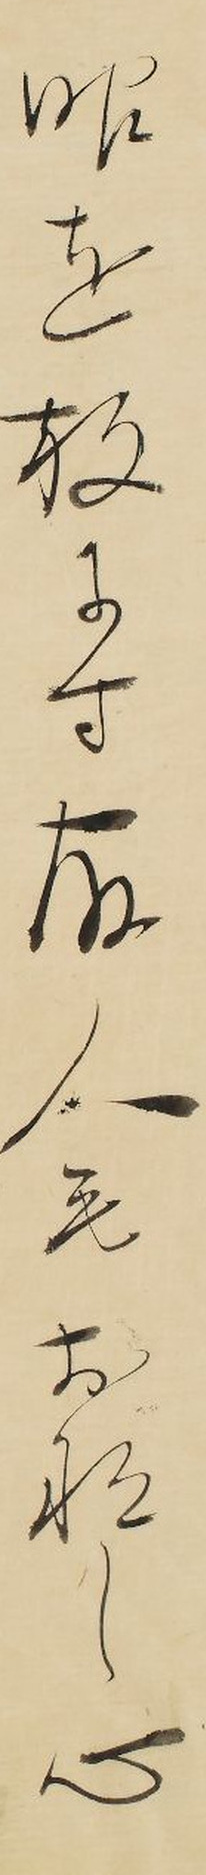眼を放にす故人もおなし心
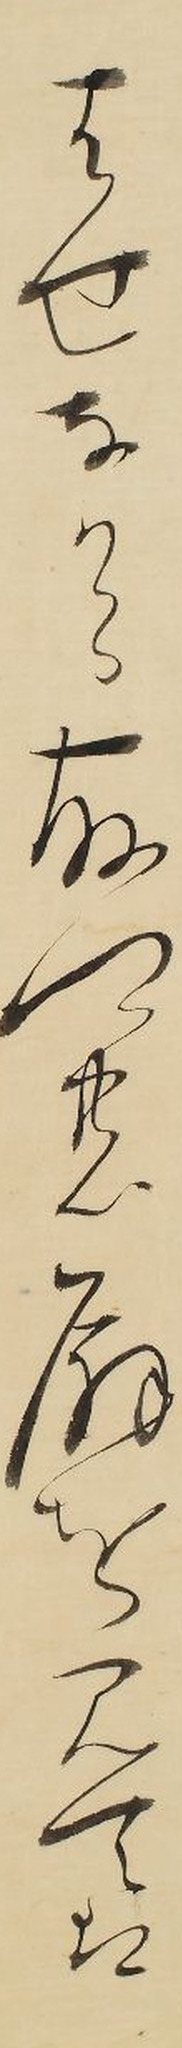はせなから故郷の扇を見ては
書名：花土産
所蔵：徳島県立図書館
